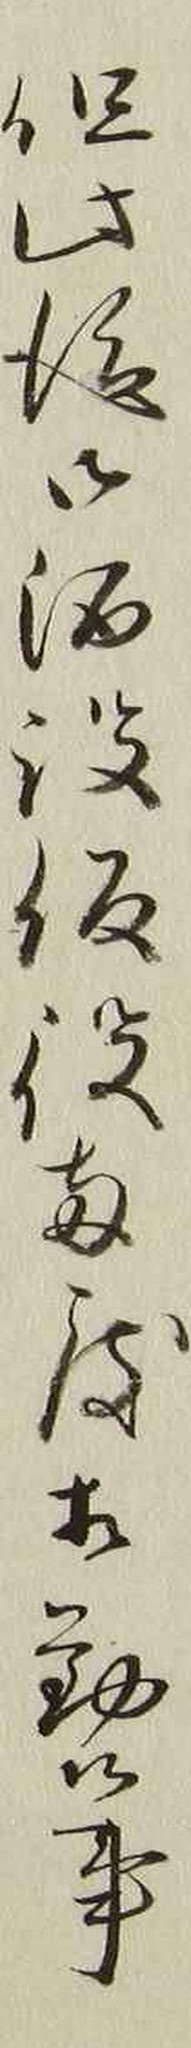但此後御酒役仮役両度相勤候事
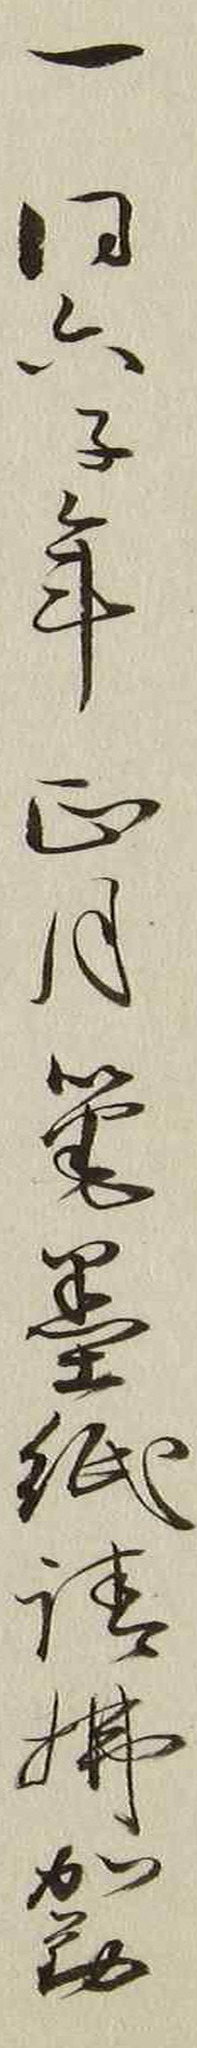一同六子年正月筆墨紙請払加勤
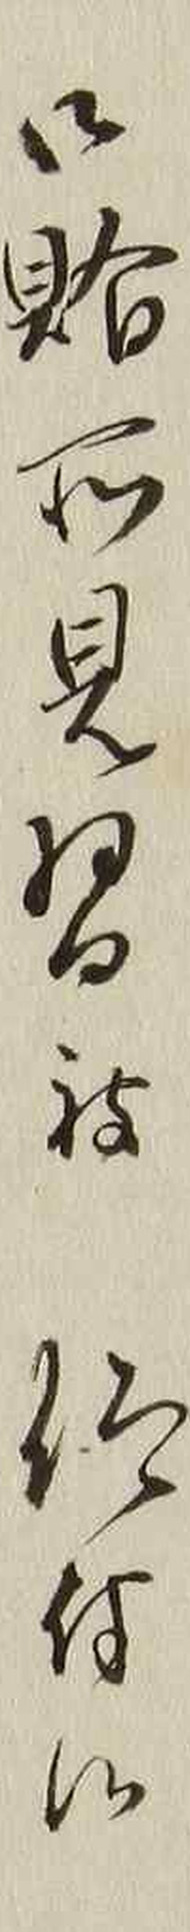御賄所見習被仰付候
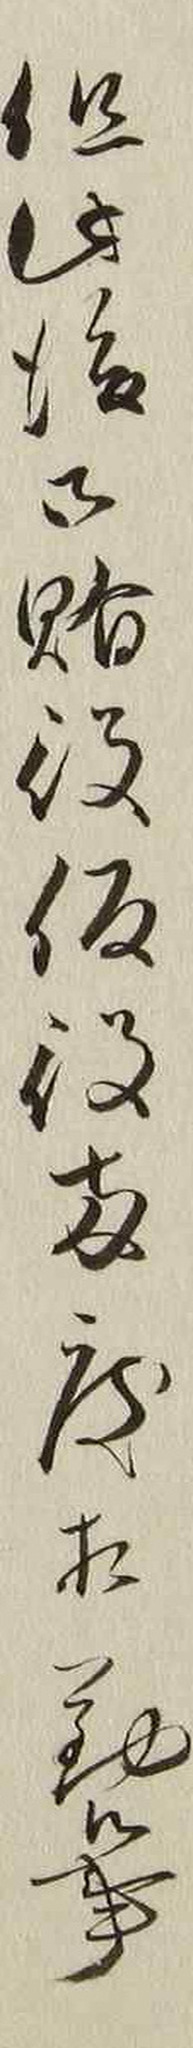但此後御賄役仮役両度相勤候事
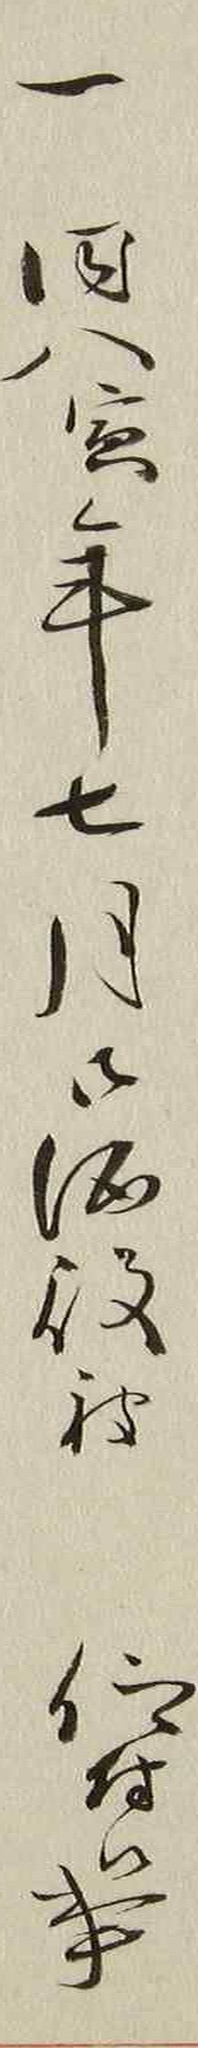一同八寅年七月御酒役被仰付候事
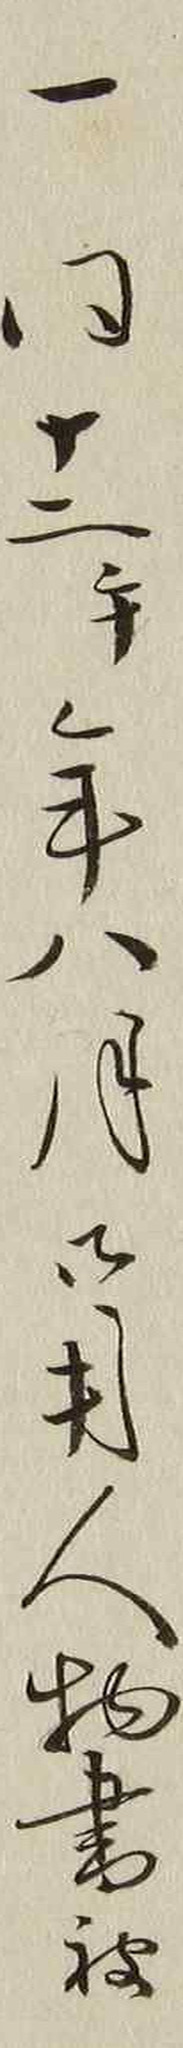一同十二午年八月御用人物書被
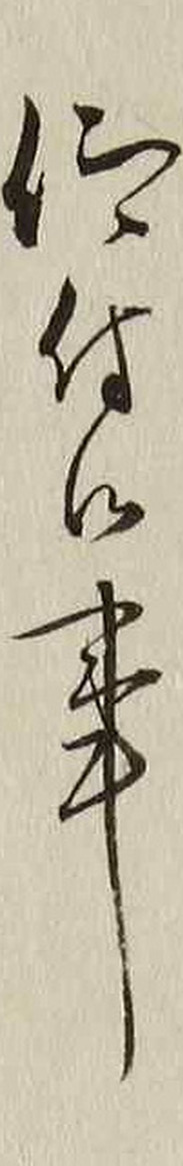仰付候事
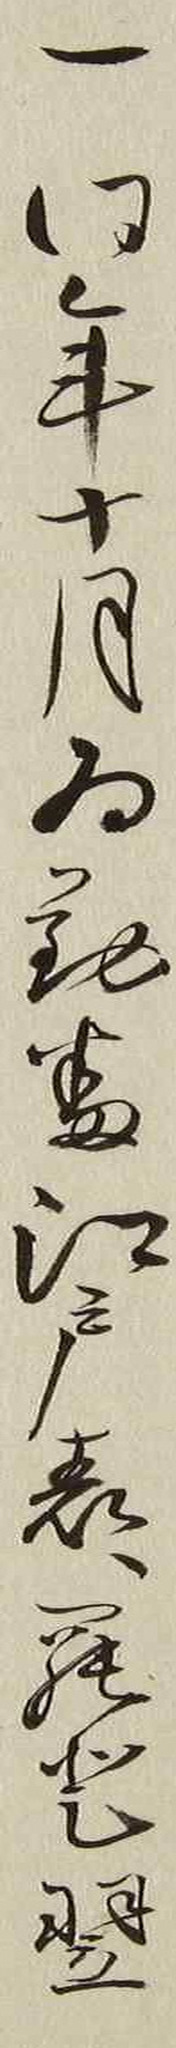一同年十月為勤番江戸表ㇸ罷登翌
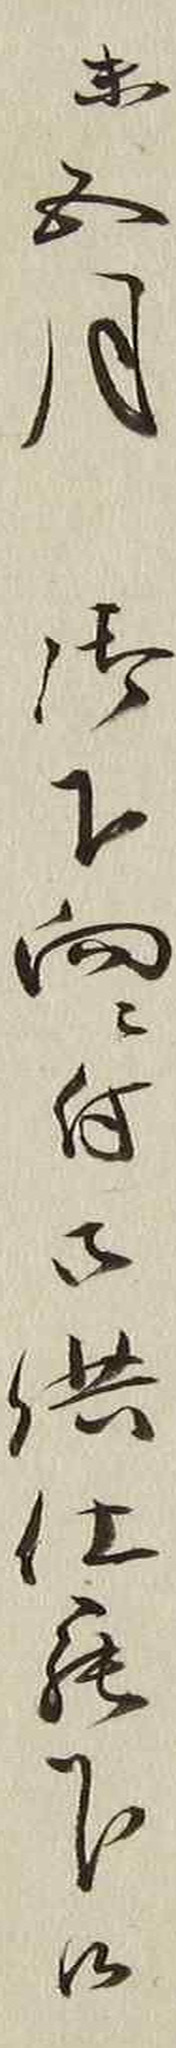未五月御下向ニ付御供仕罷下候
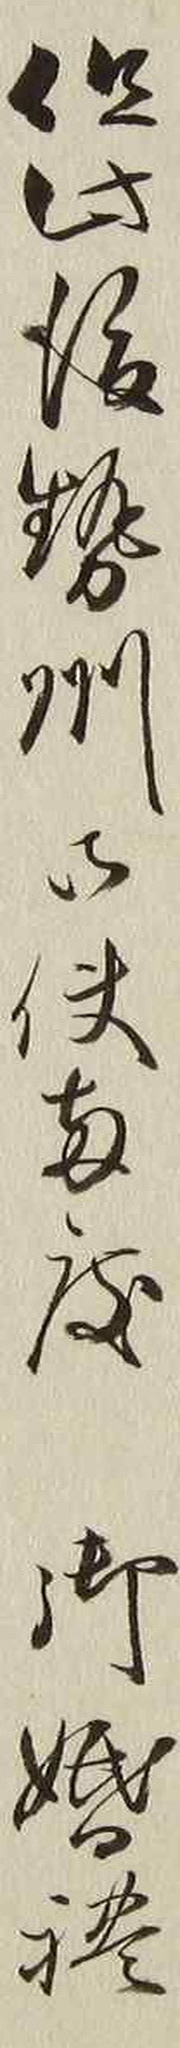但此後勢州御使両度御婚礼
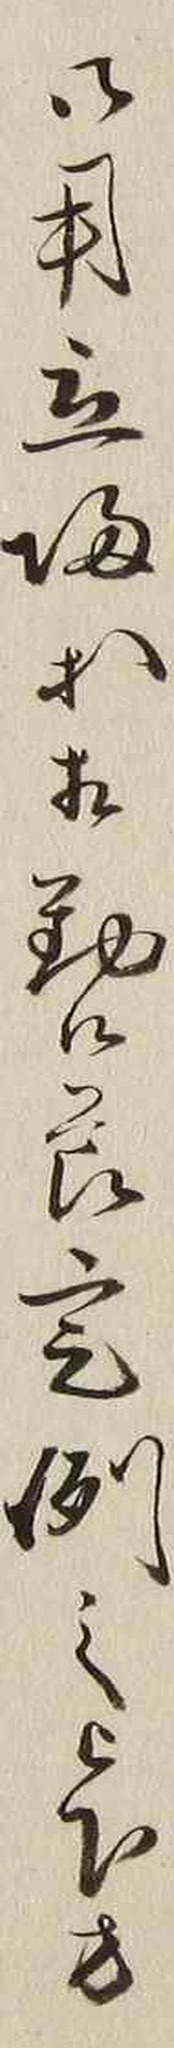御用立帰等相勤候節定例之被下方
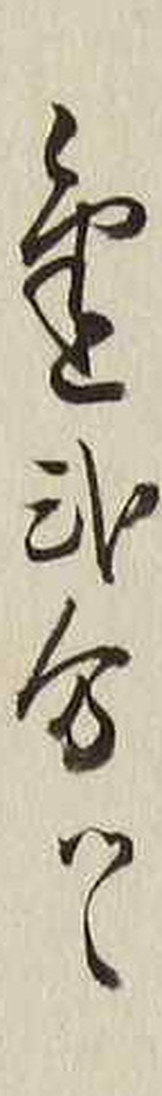金弐分ッヽ
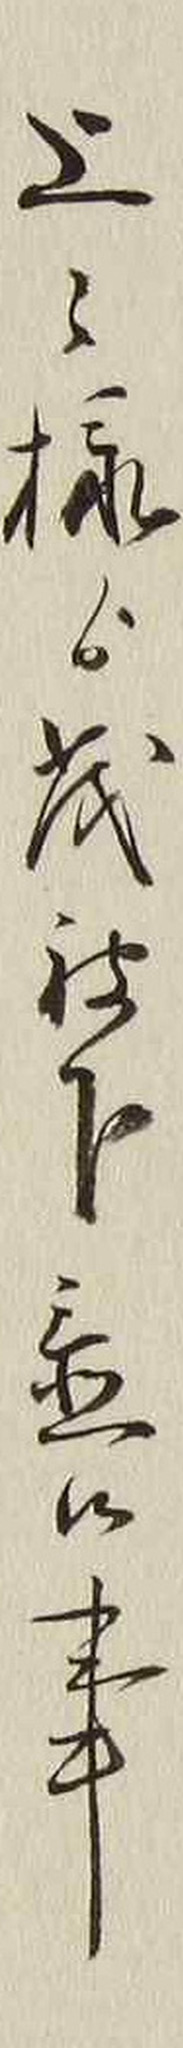上々様ゟも被下置候事
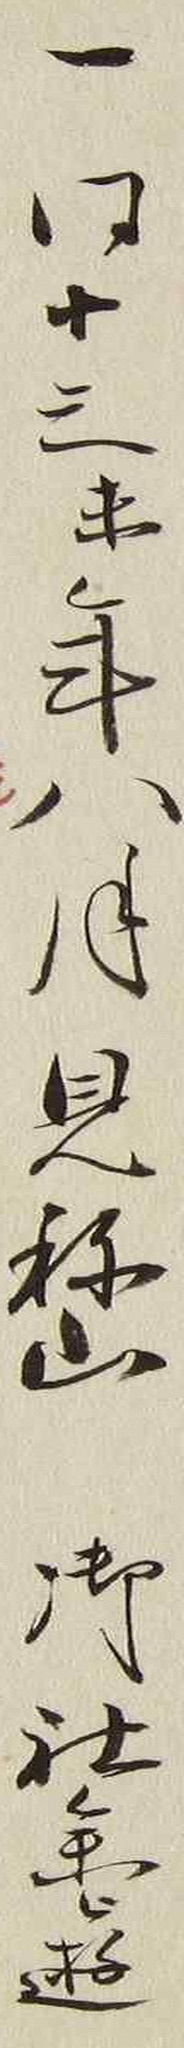一同十三未年八月見祢山御社参被遊
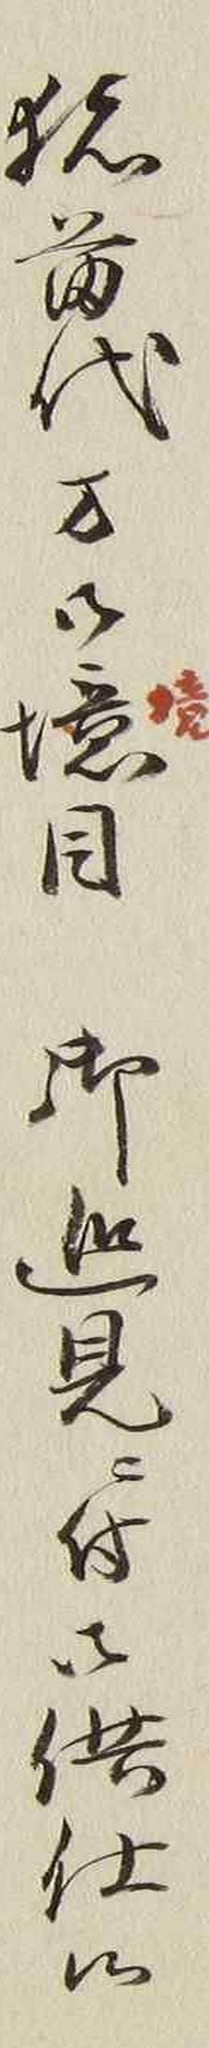猪苗代万御境目御巡見ニ付御供仕候
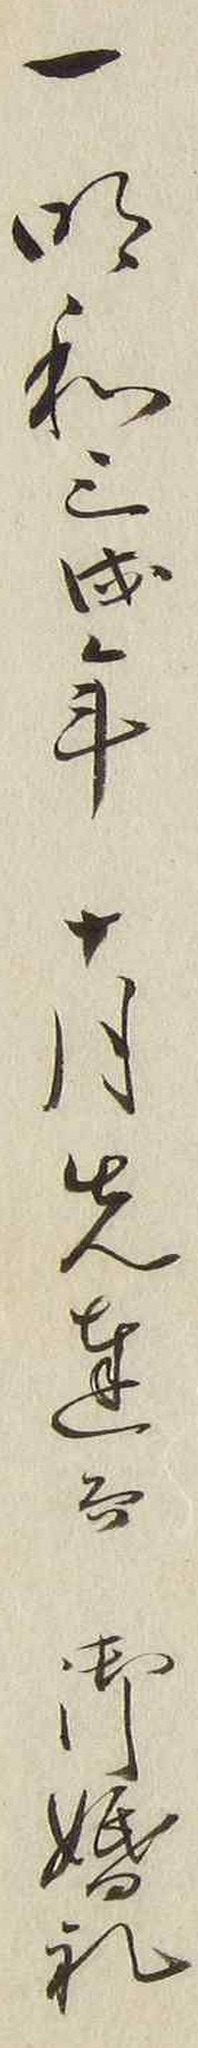一明和三戌年十月先達而御婚礼
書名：諸士系譜　巻之163　な之部5
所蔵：会津若松市立会津図書館
